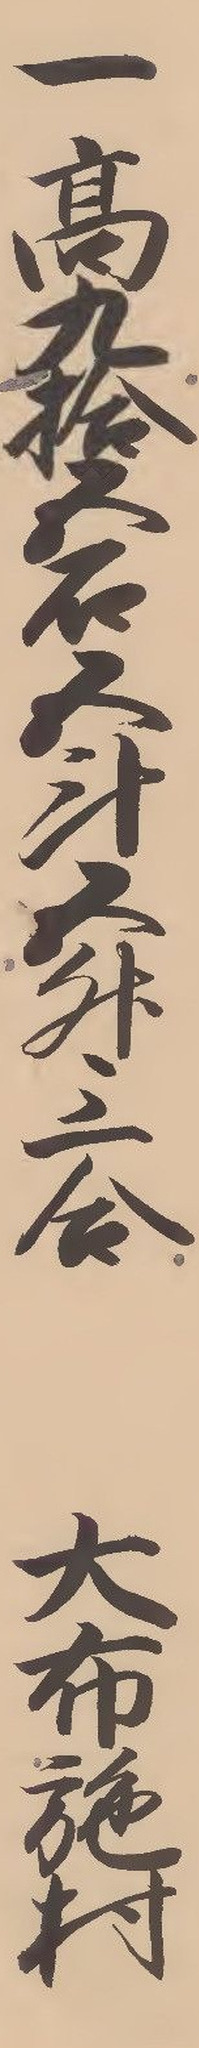一高九拾五石五斗五升三合大布施村
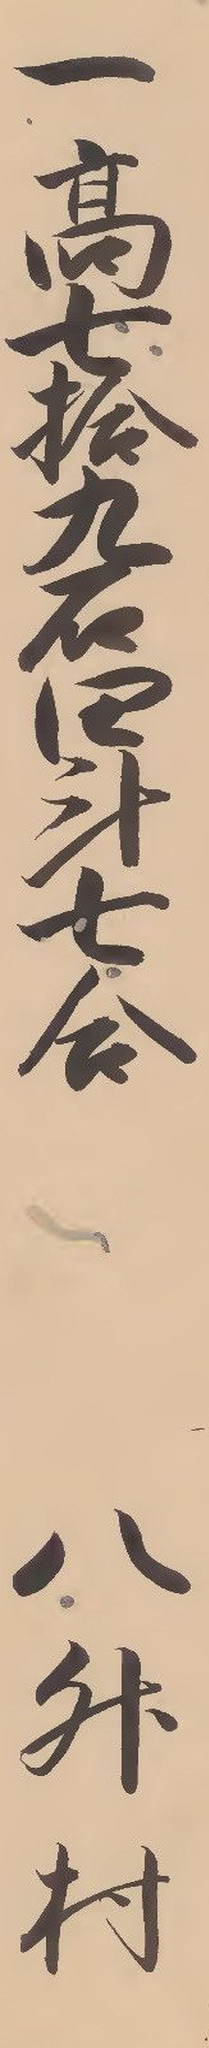一高七拾九石四斗七合八升村

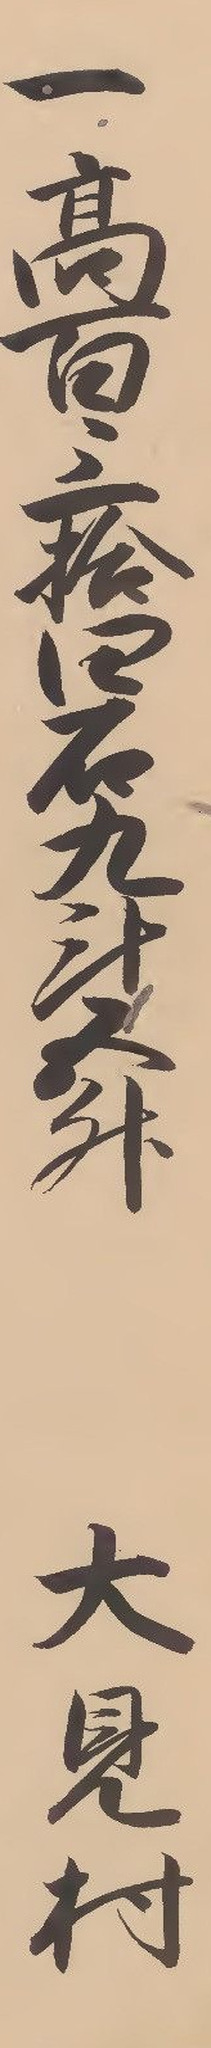一高百三拾四石九斗五升大見村
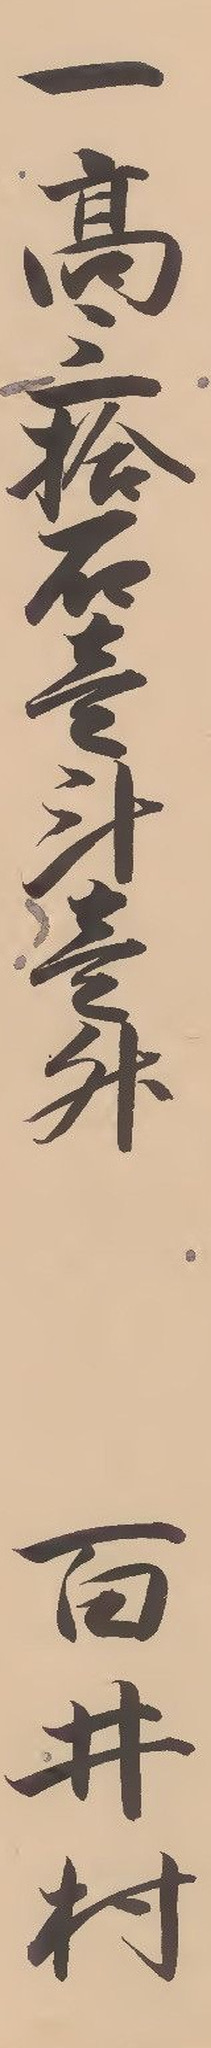一高三拾石壱斗壱升百井村
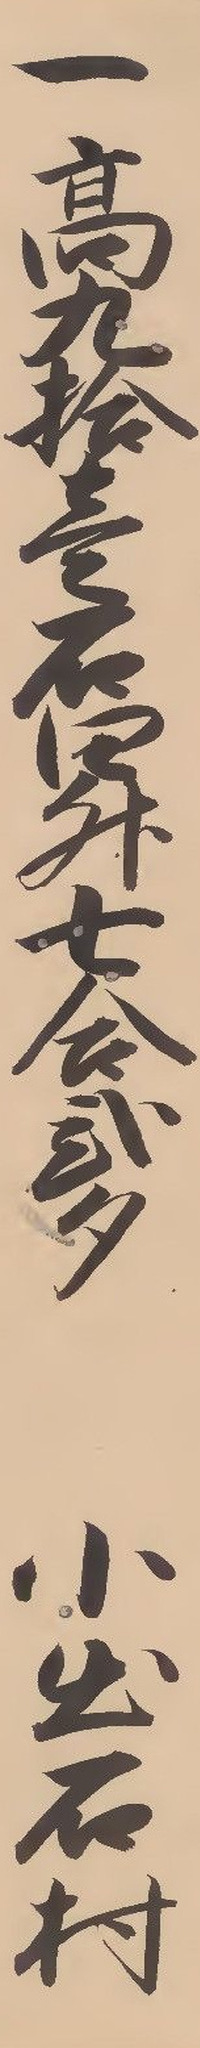一高九拾壱石四升七合弐勺小出石村
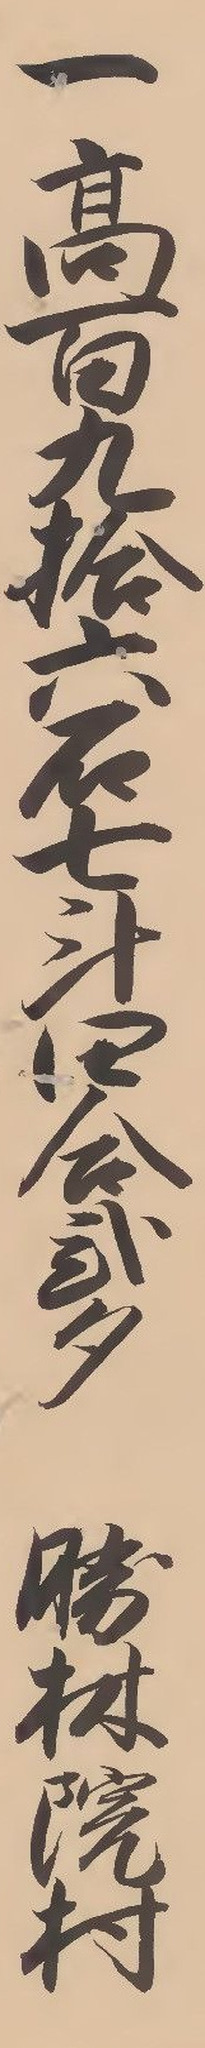一高百九拾六石七斗四合弐勺勝林院村
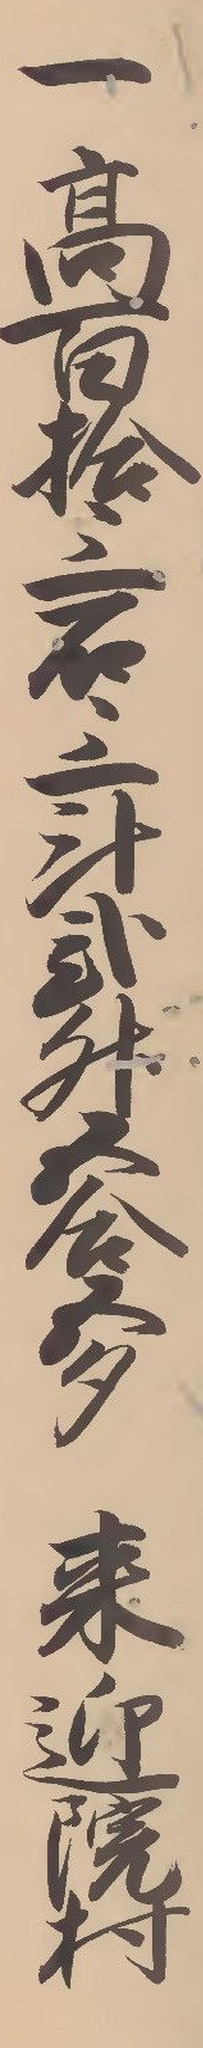一高百拾三石三斗弐升五合五勺来迎院村
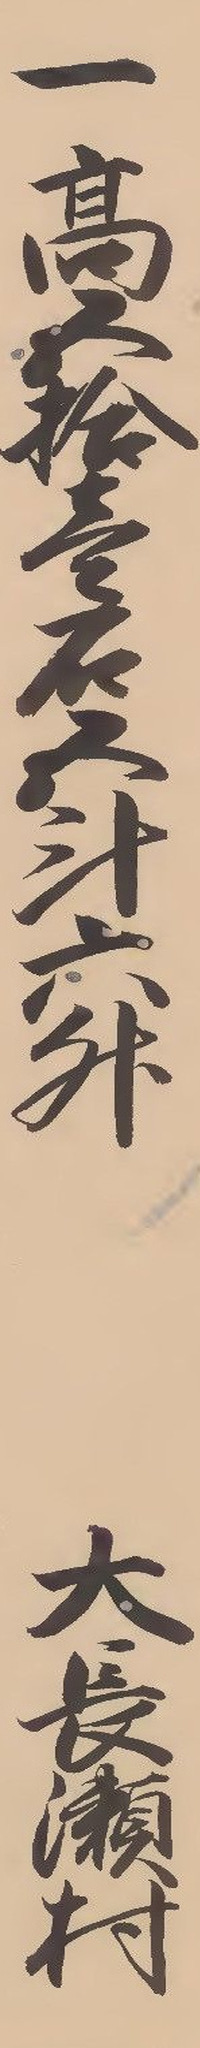一高五拾壱石五斗六升大長瀬村
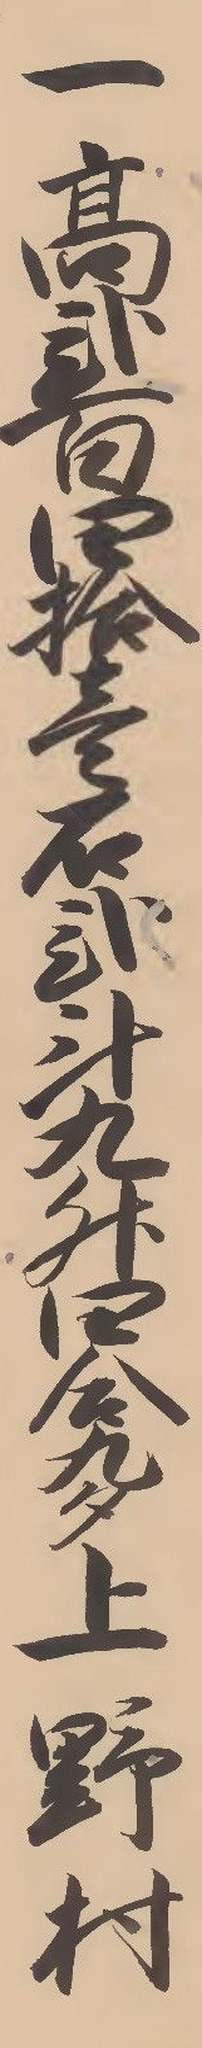一高弐百四拾壱石弐斗九升四合九勺上野村
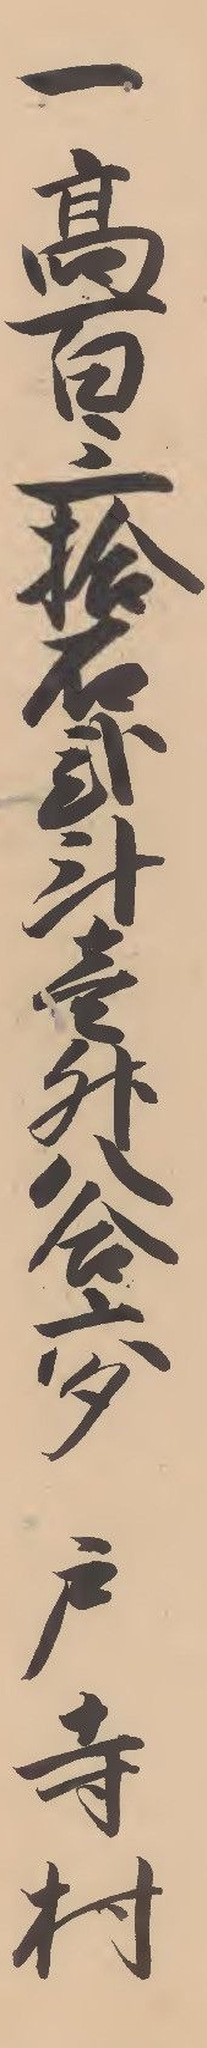一高百三拾石弐斗壱升八合六勺戸寺村

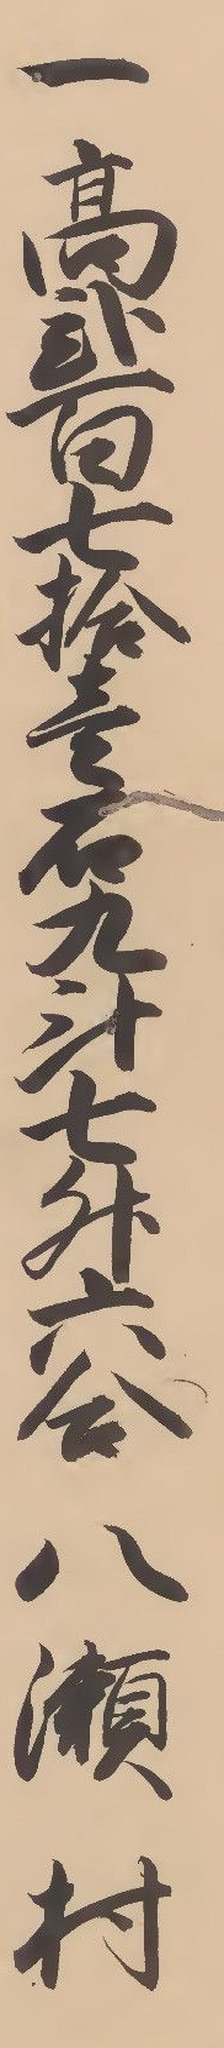一高弐百七拾壱石九斗七升六合八瀬村
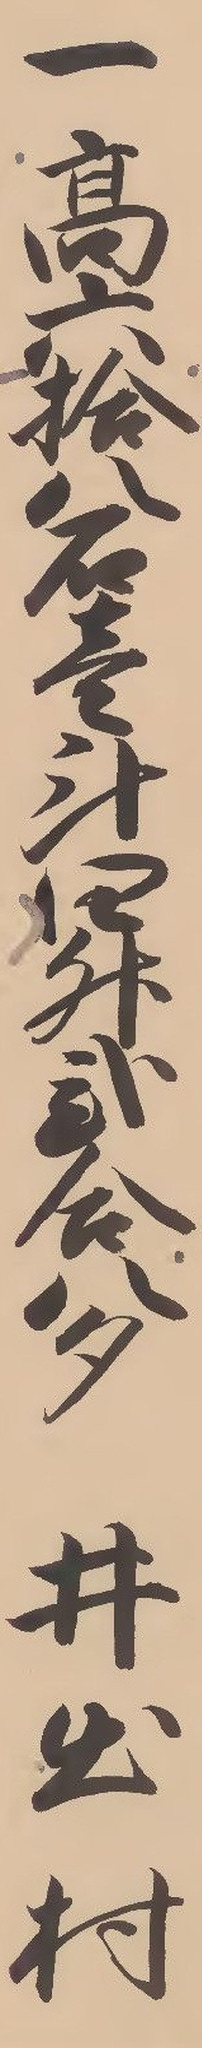一高六拾八石壱斗四升弐合八勺井出村
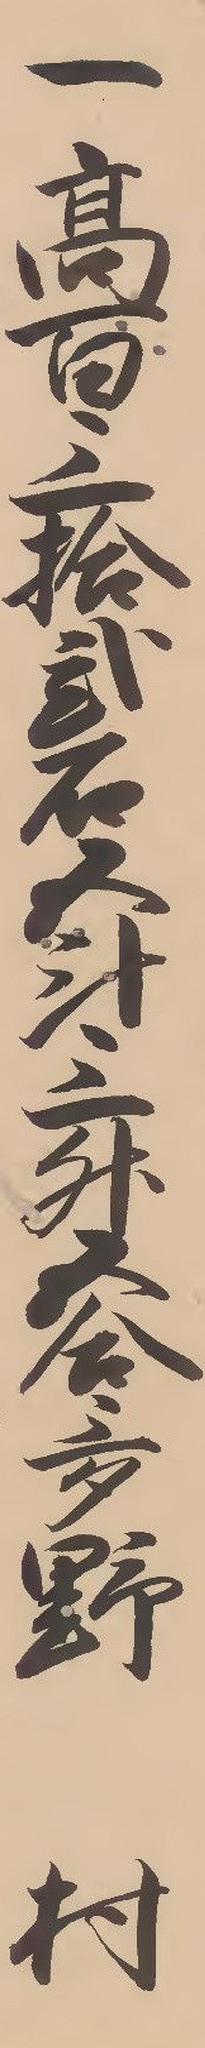一高百三拾弐石五斗三升五合三勺野村
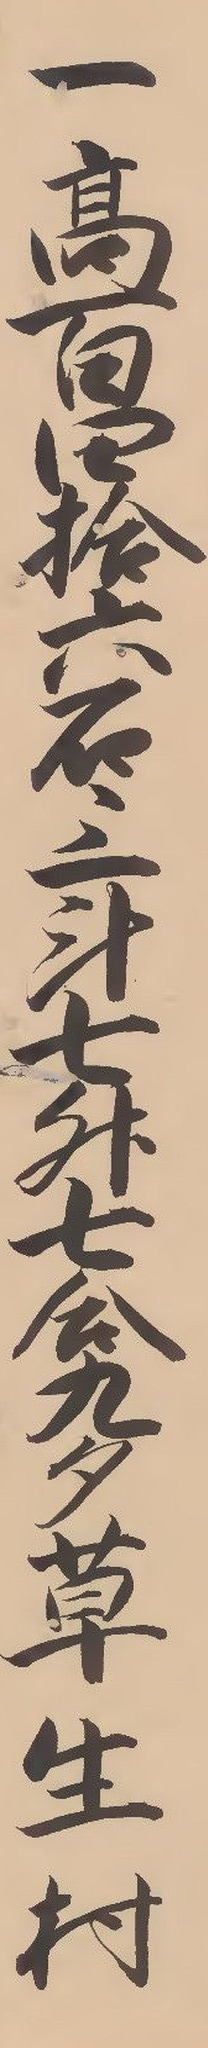一高百四拾六石三斗七升七合九勺草生村
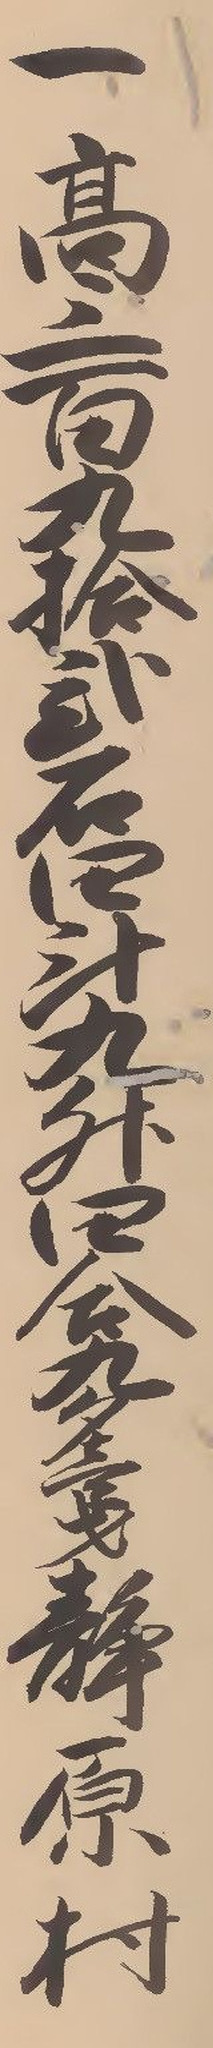一高三百九拾弐石四斗九升四合九勺壱才静原村
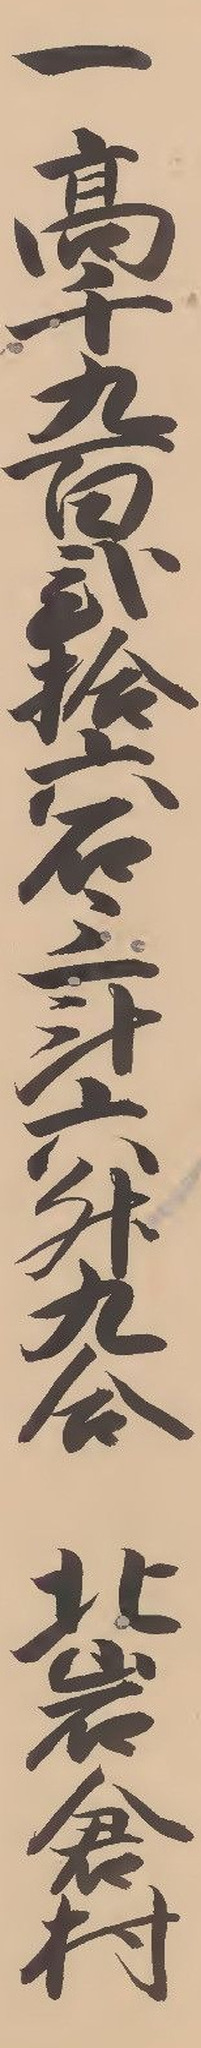一高千九百弐拾六石三斗六升九合北岩倉村
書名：山城国郷帳
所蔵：国立公文書館 National Archives of Japan
